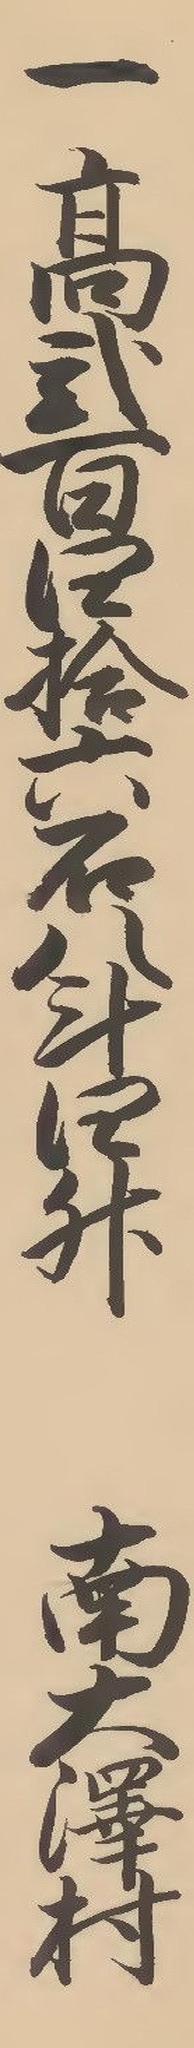一髙弐百四拾六石八斗四升南大澤村
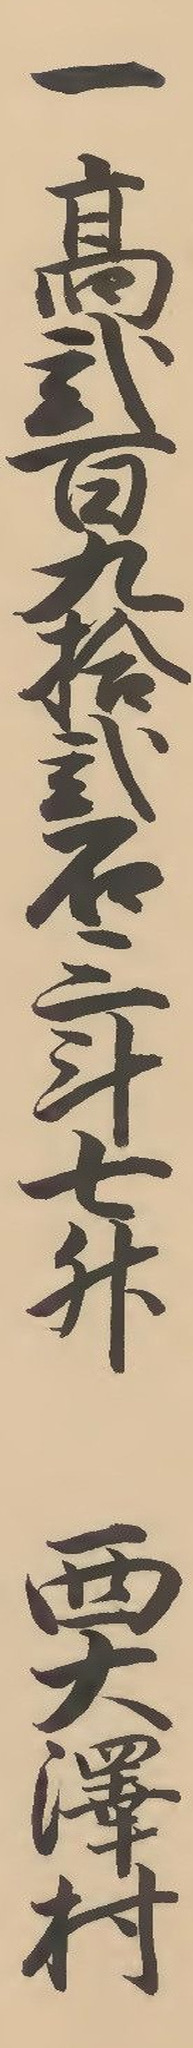一髙弐百九拾弐石三斗七升西大澤村
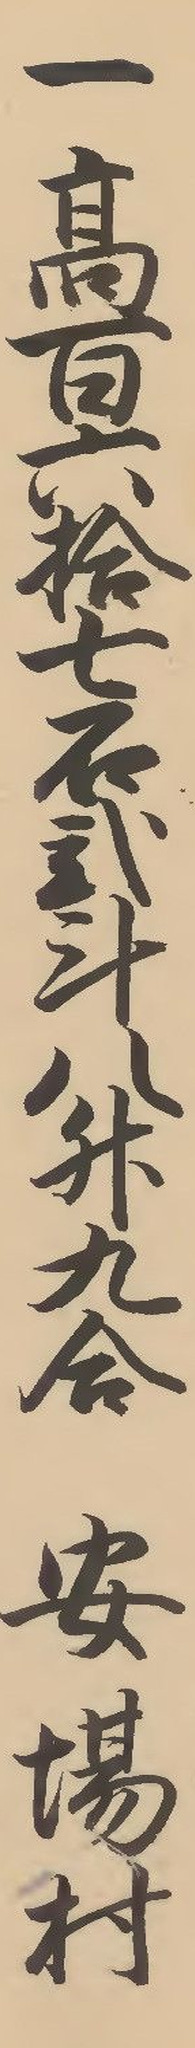一髙百六拾七石弐斗八升九合安場村

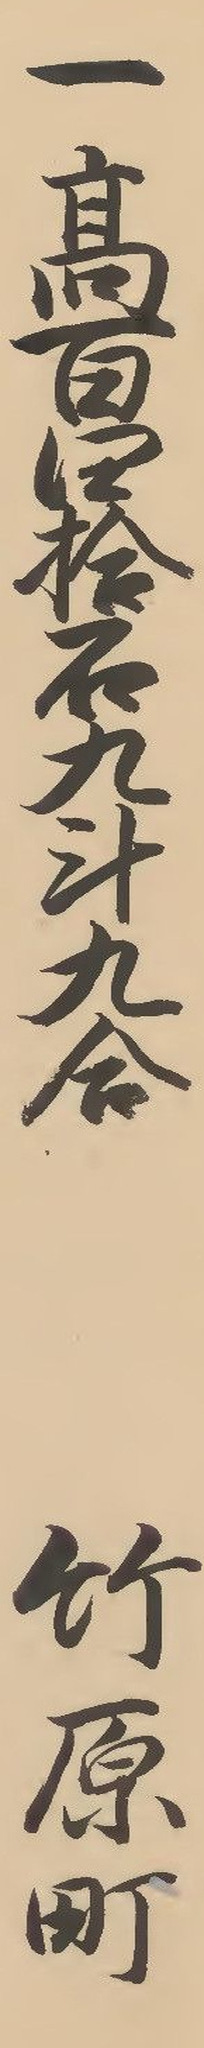一髙百四拾石九斗九合竹原村
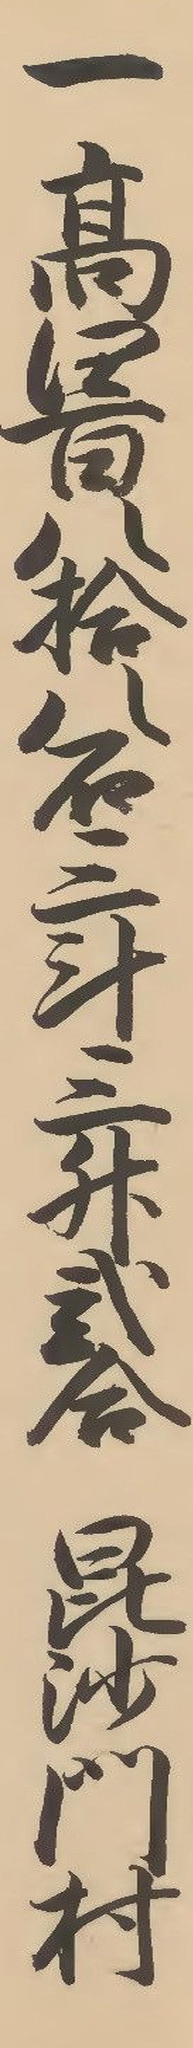一髙四百八拾八石三斗三升弐合毘沙門村
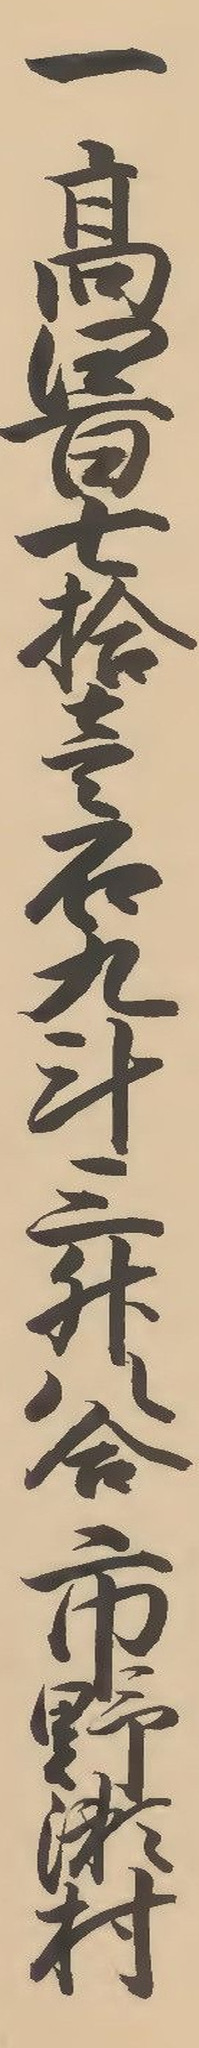一髙四百七拾壱石九斗三升八合市野瀬村
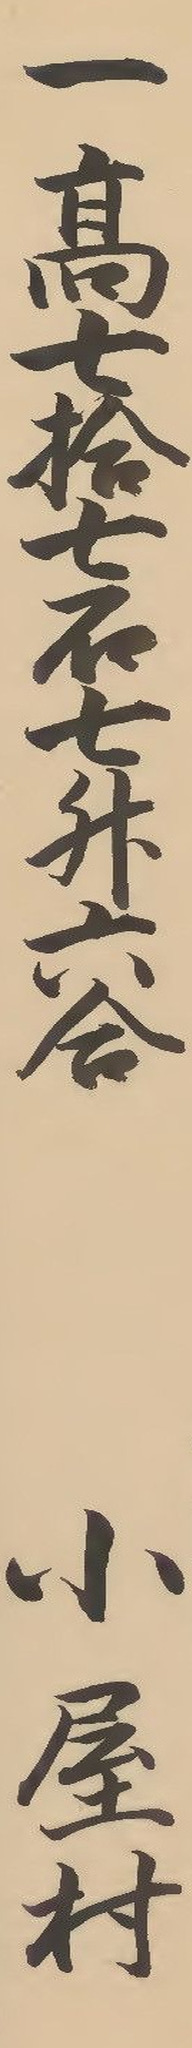一髙七拾七石七升六合小屋村
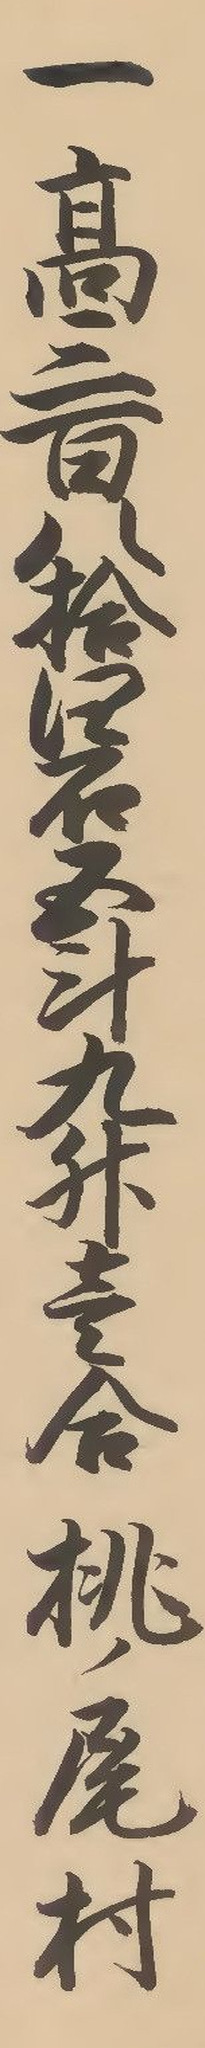一髙弐百八拾四石五斗九升壱合桃ノ尾村
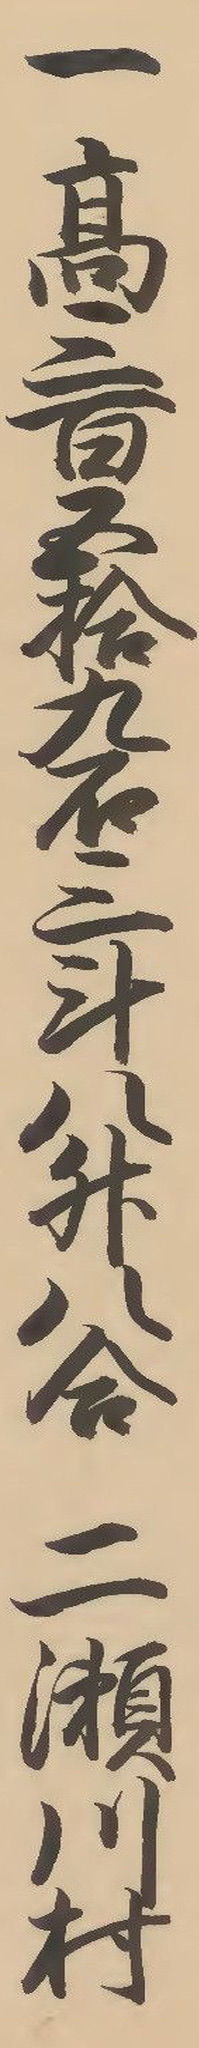一髙三百五拾九石三斗八升八合二瀬川村
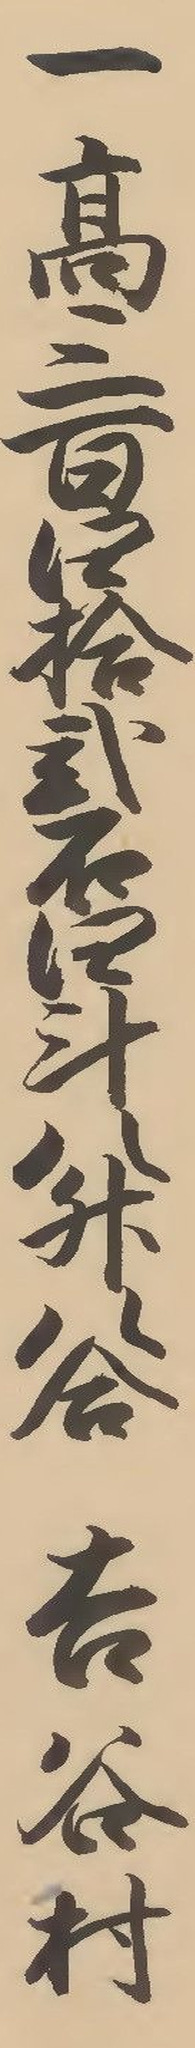一髙三百四拾弐石四斗八升八合吉谷村

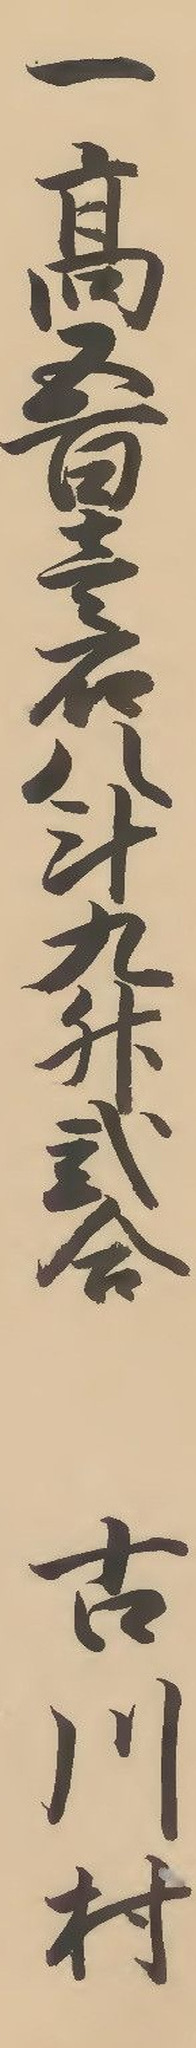一髙五百壱石八斗九升弐合古川村
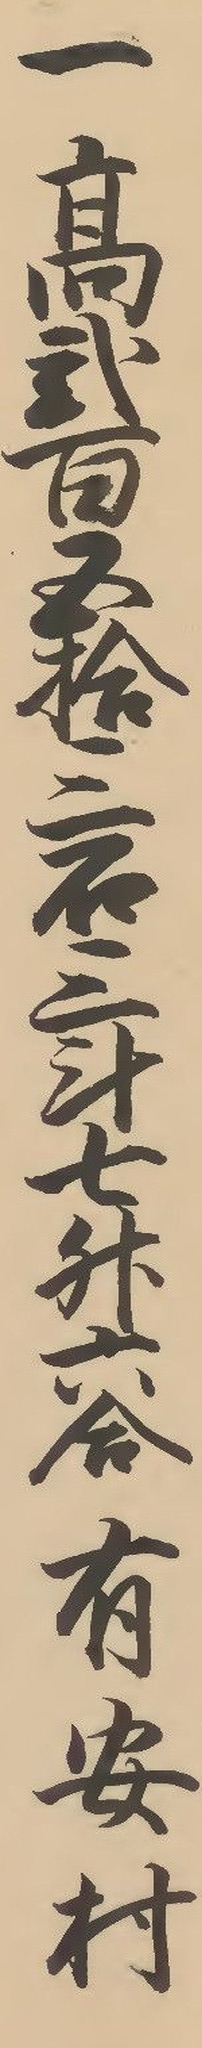一髙弐百五拾三石三斗七升六合有安村
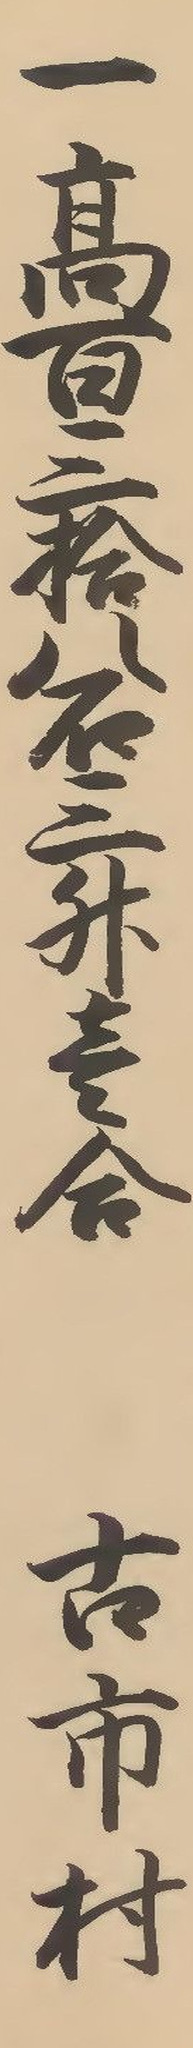一髙百三拾八石三升壱合古市村
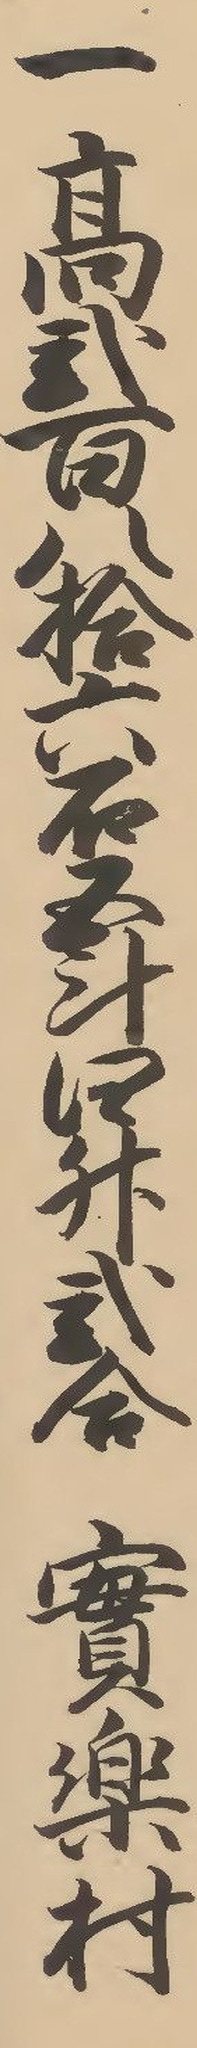一髙弐百八拾六石五斗四升弐合實樂村
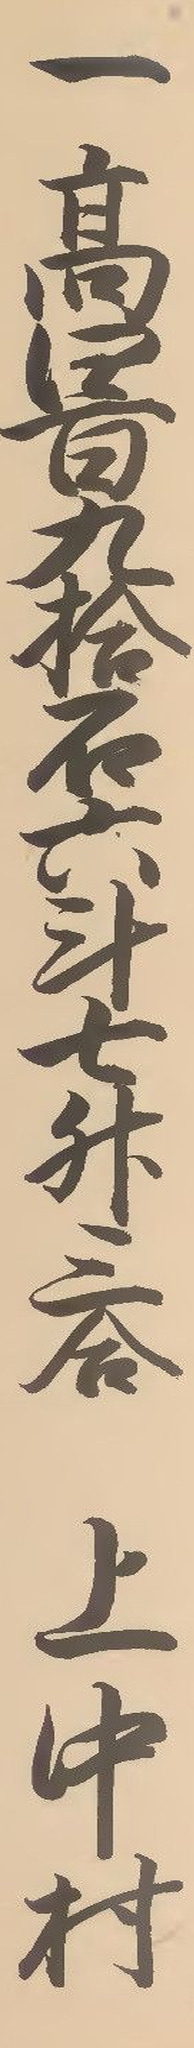一髙四百九拾石六斗七升三合上中村
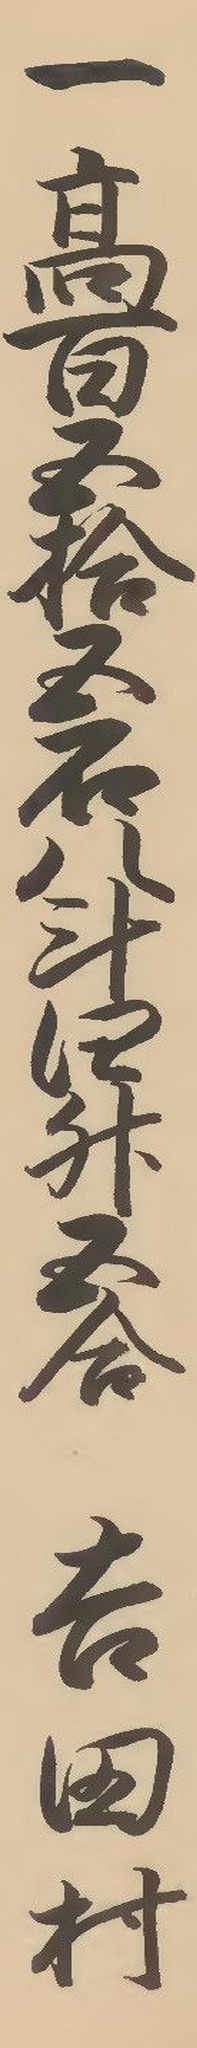一た百五拾五石八斗四升五合吉田村
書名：播磨国郷帳
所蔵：国立公文書館 National Archives of Japan
